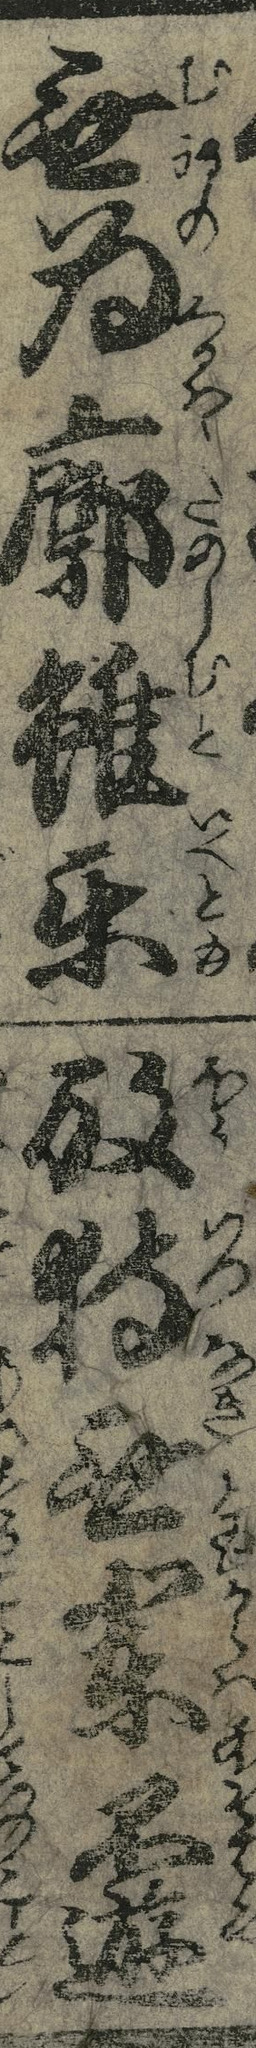無為廓雖楽放特無輩不遊
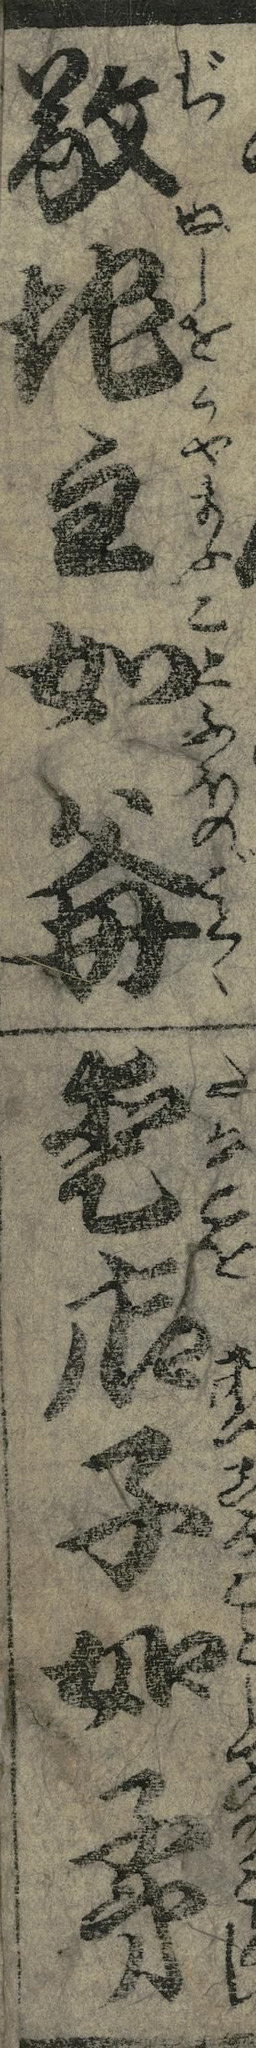敬地主如父母愛店子如子弟

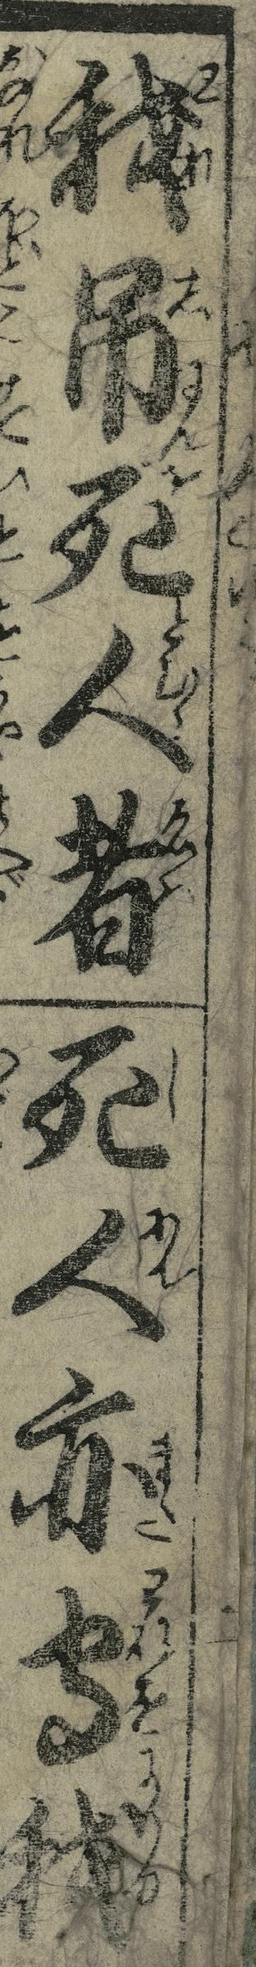我吊死人者死人亦守我
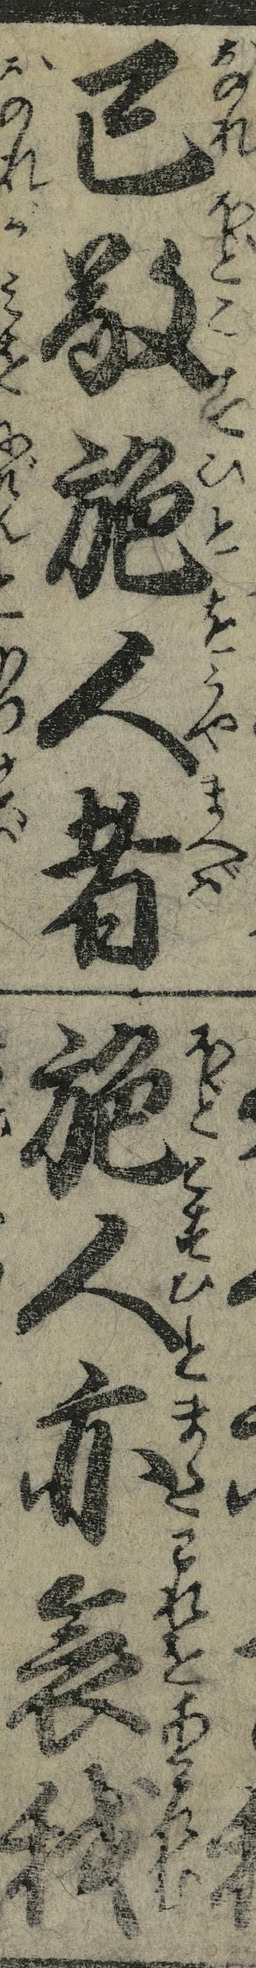己敬施人者施人亦哀我
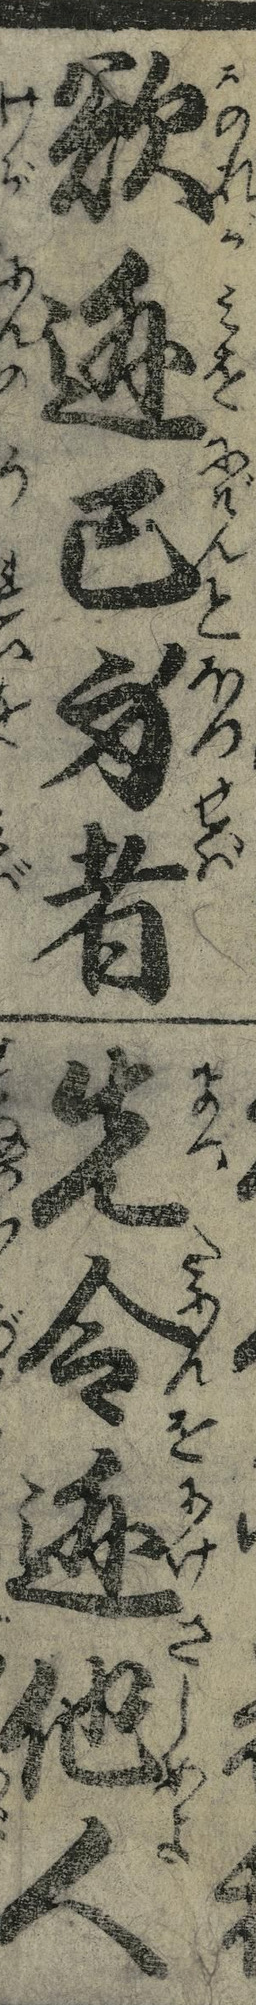欲逃己身者先令逃他人
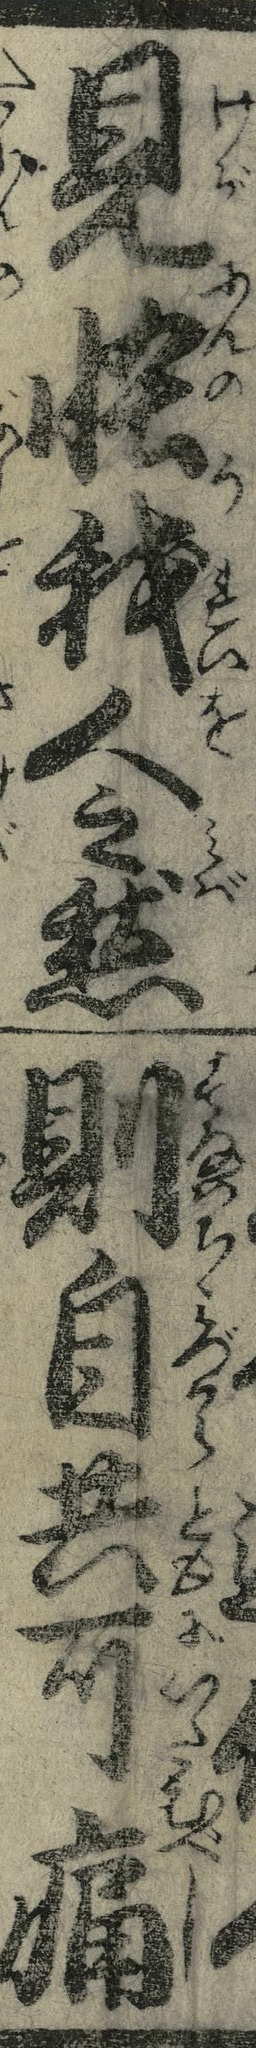見怪我人之愁則自共可痛
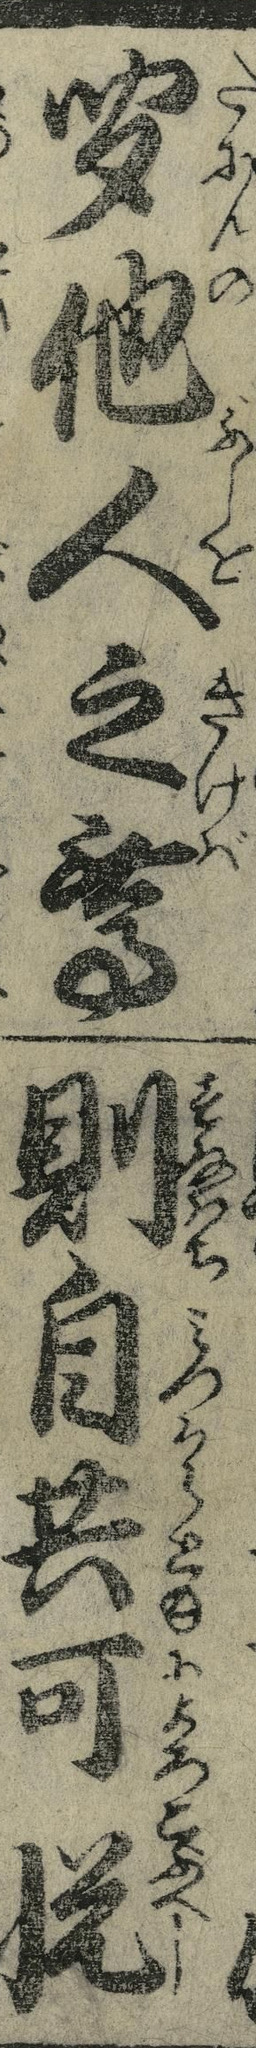聞他人之無事則自共可悦
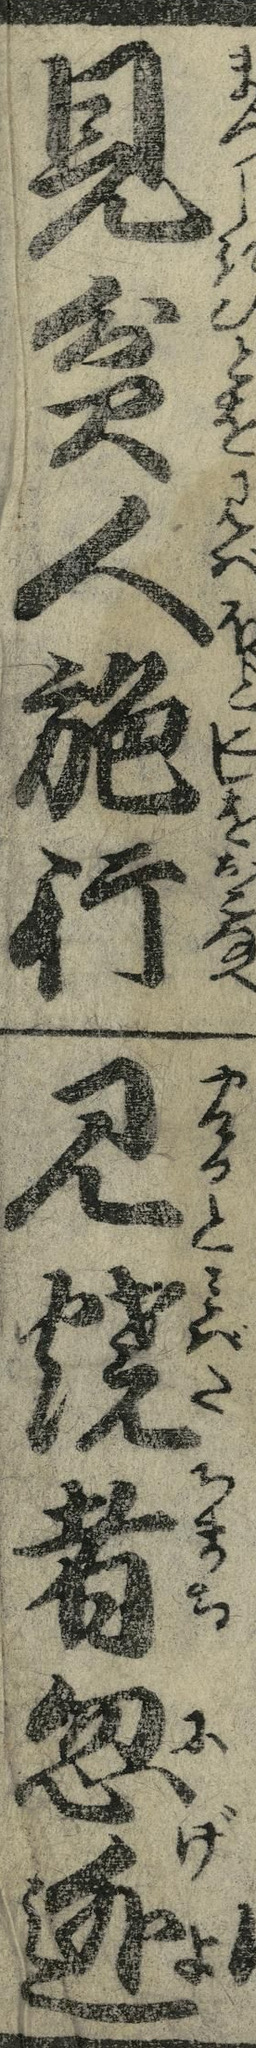見貧人施行見焼者忽逃
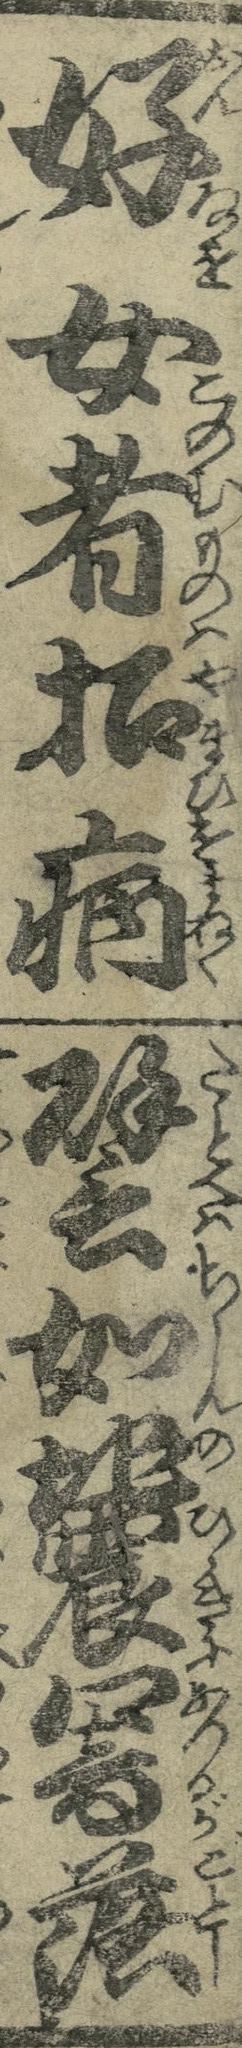好女者招病譬如地震響落
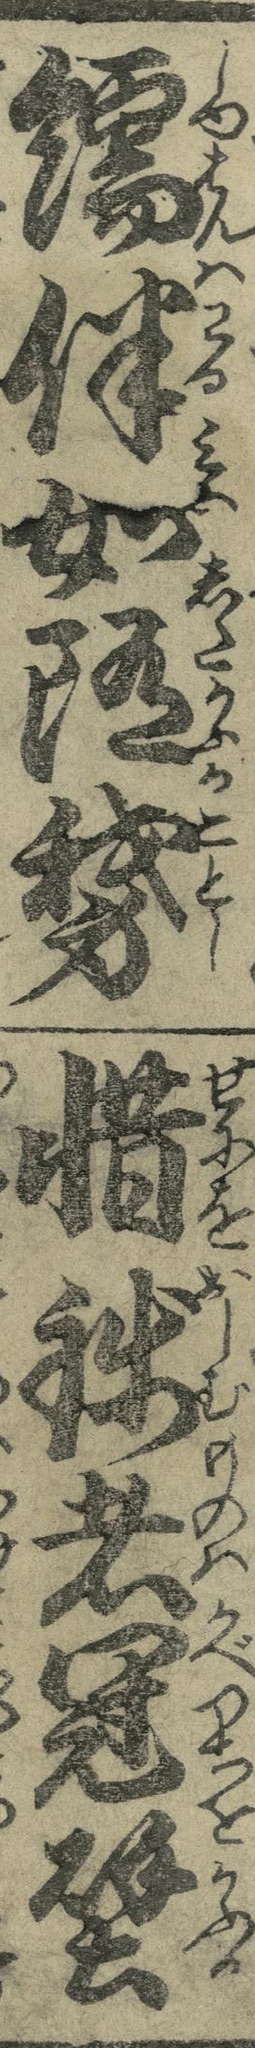繻伴如随我身惜銭者冠壁
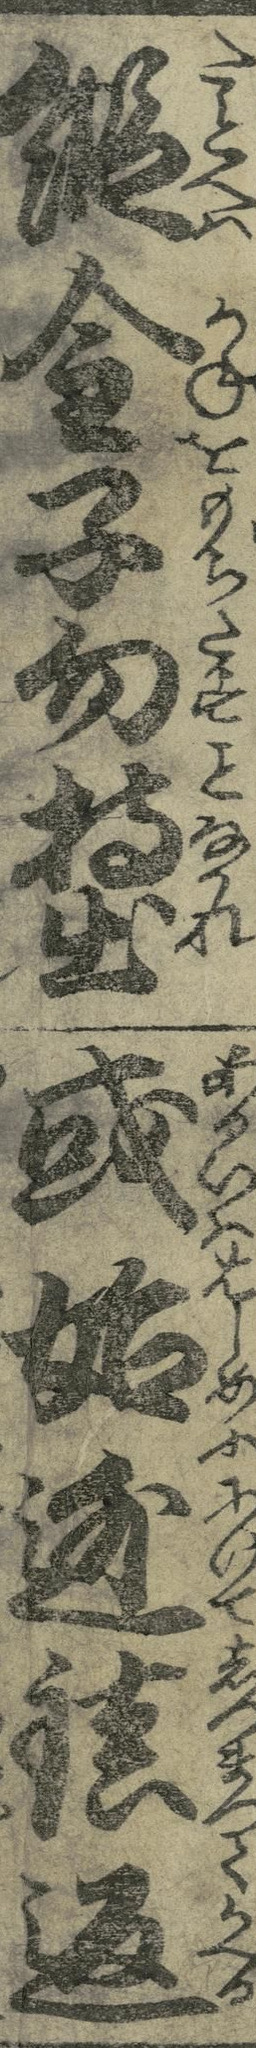縦金子勿持出或始逃鎭返
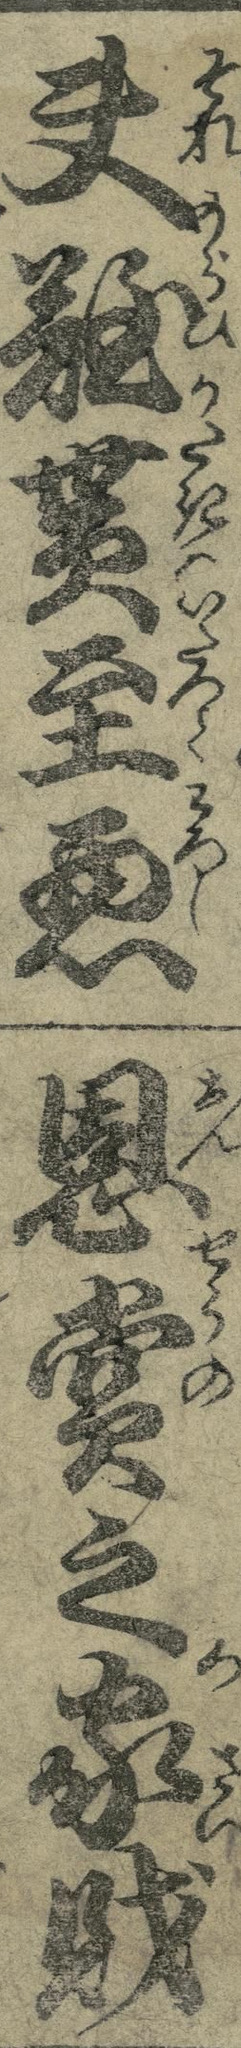夫難貰至悪恩賞之家財
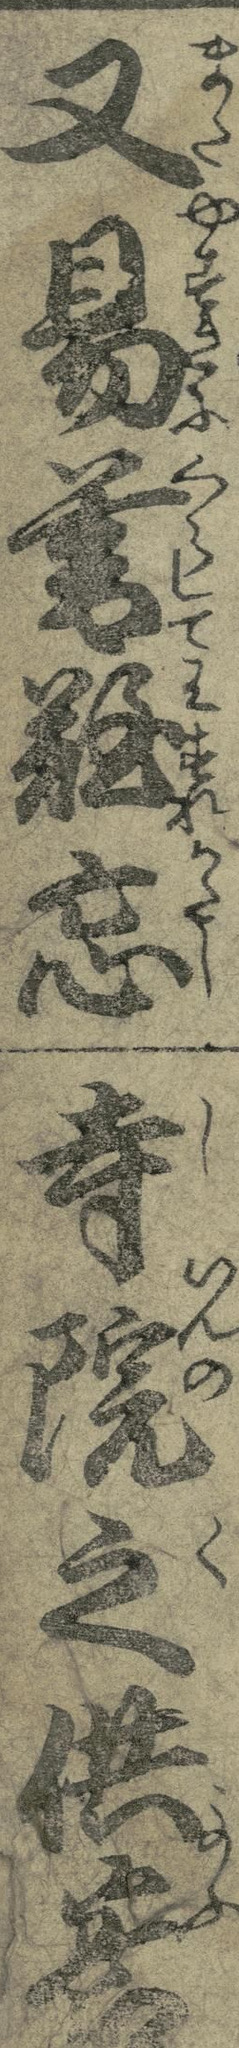又易暮難忘寺院之供養

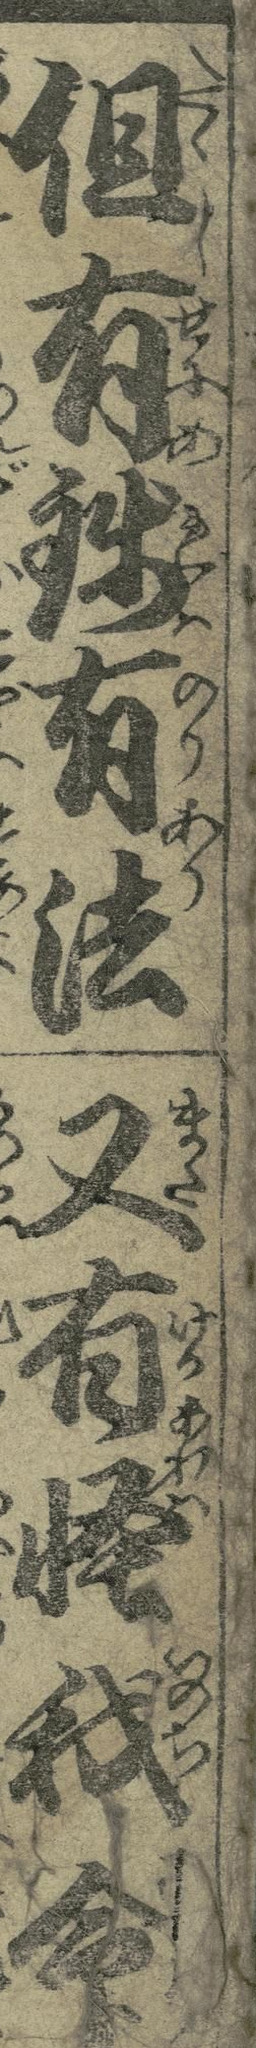但有銭有法又有怪我命
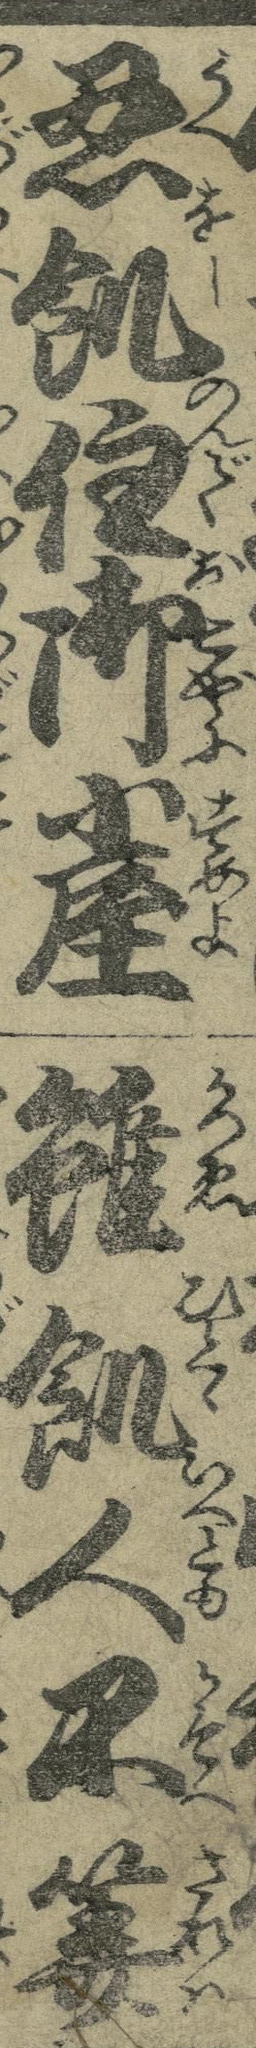忍飢住御小屋雖飢人不算
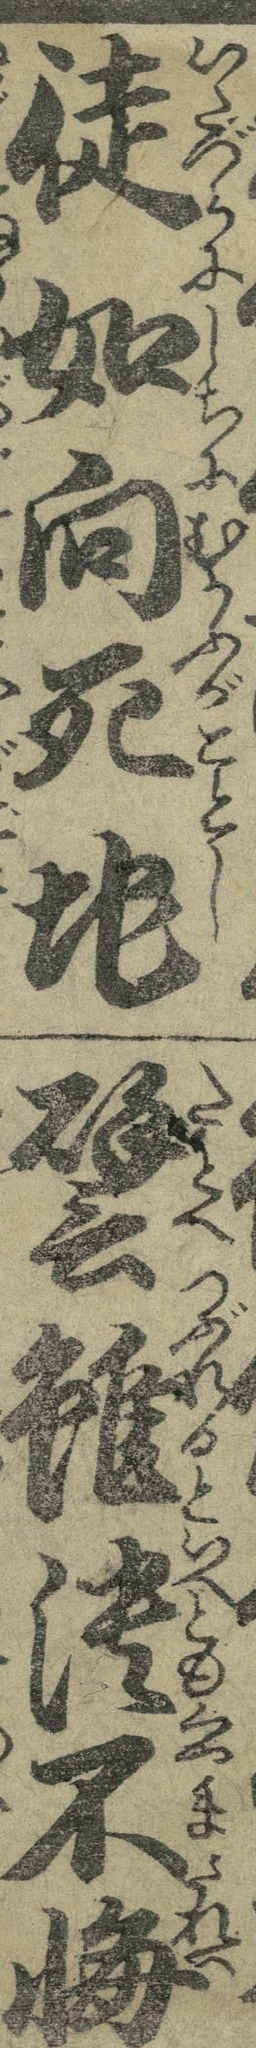徒如向死地譬雖潰不悔
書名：大江戸　地震後教　人事改正　平かな附
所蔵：東京大学地震研究所図書室 Earthquake Research Institute Library, The University of Tokyo, JAPAN
